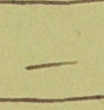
--
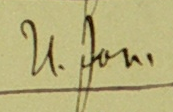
21. Jan.
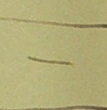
--
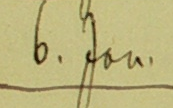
6. Jan.
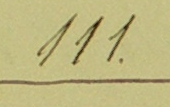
111
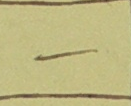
--
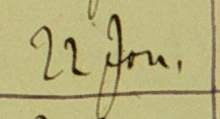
22. Jan
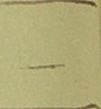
--
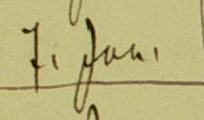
7. Jan.
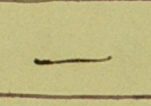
--
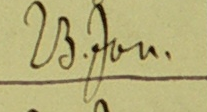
23. Jan.
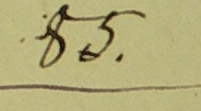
85
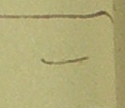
--
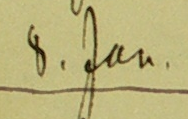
8. Jan.
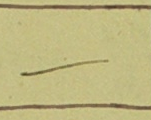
--
